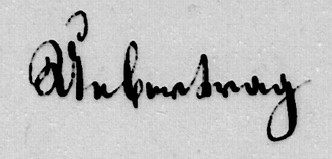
Uebertrag
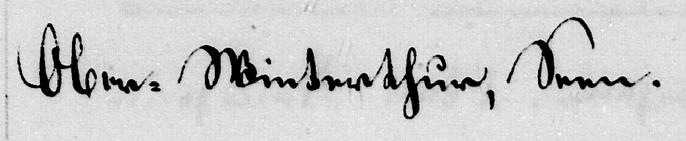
Ober-Winterthur, Seen.
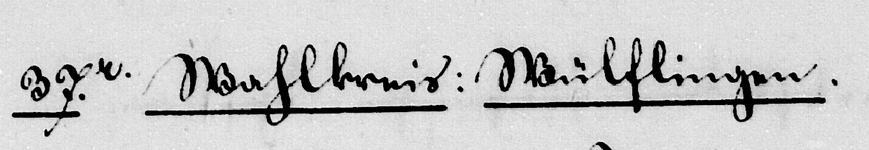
37.r. Wahlkreis: Wülflingen.
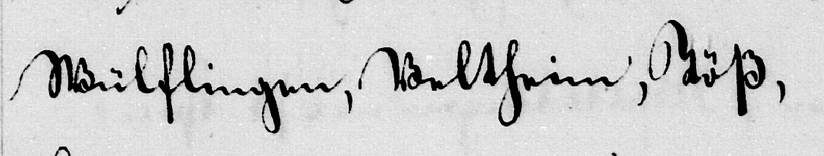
Wülflingen, Veltheim, Töß,
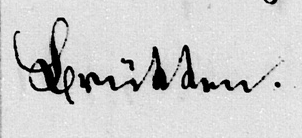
Brütten.
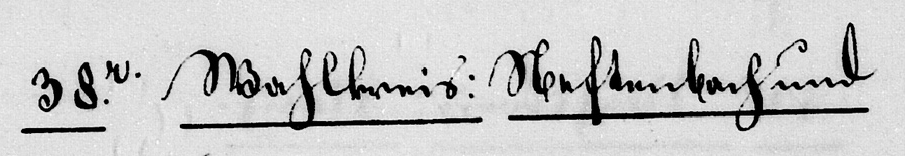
38.r. Wahlkreis: Neftenbach und
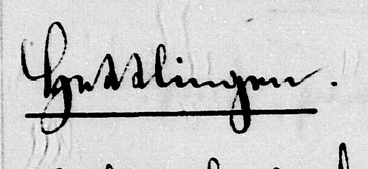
Hettlingen.
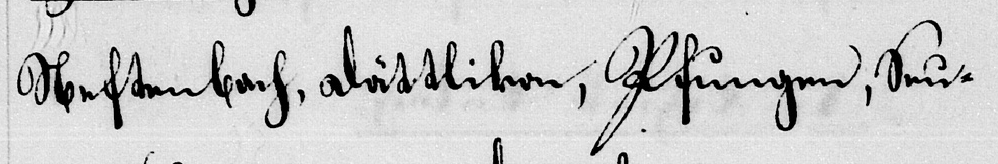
Neftenbach, Dättlikon, Pfungen, Seu¬
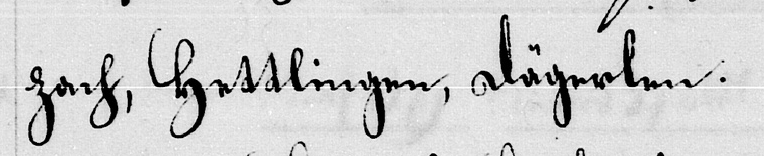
zach, Hettlingen, Dägerlen.
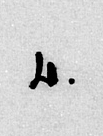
4.
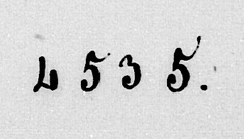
4535.
